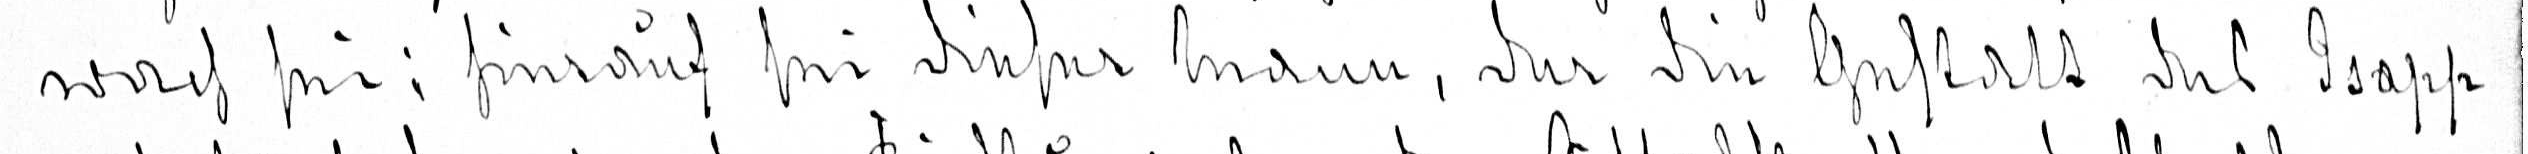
wach sei; hierauf sei dieser Mann, der die Gestalt des Isopp
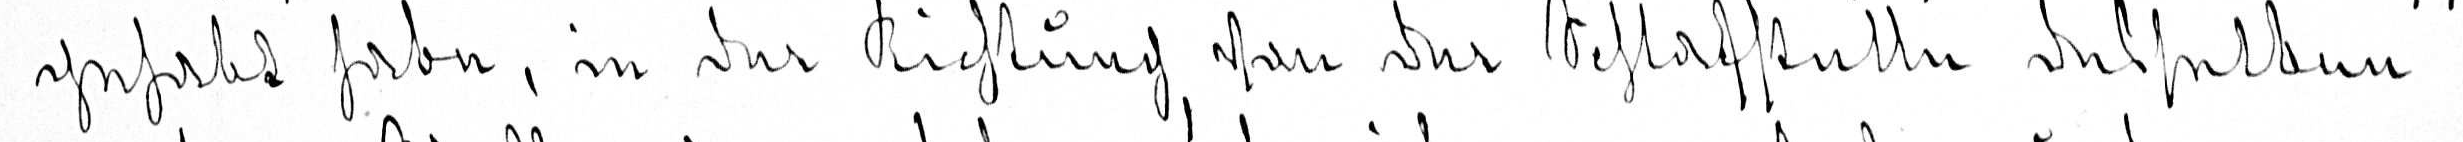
gehabt habe, in der Richtung von der Schlafstelle diesselben
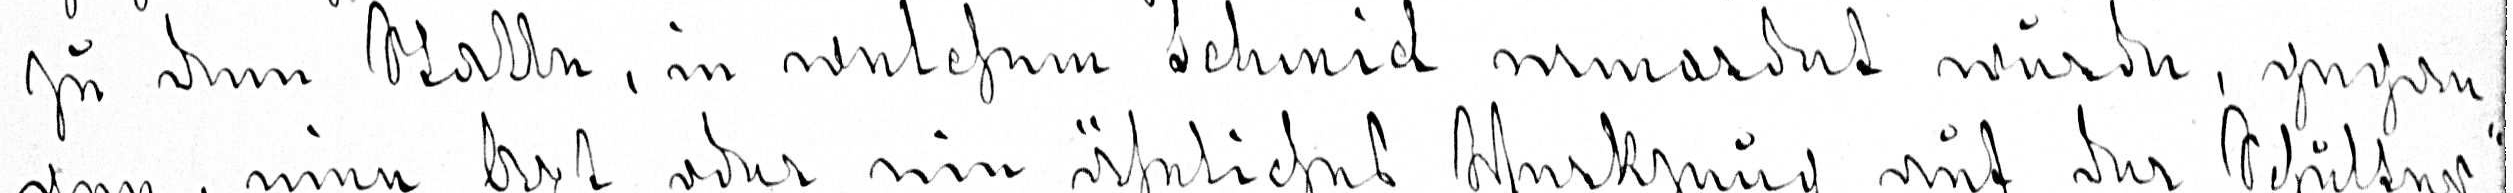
zu dem Stalle, in welchem Schmid ermordet wurde, gegan¬
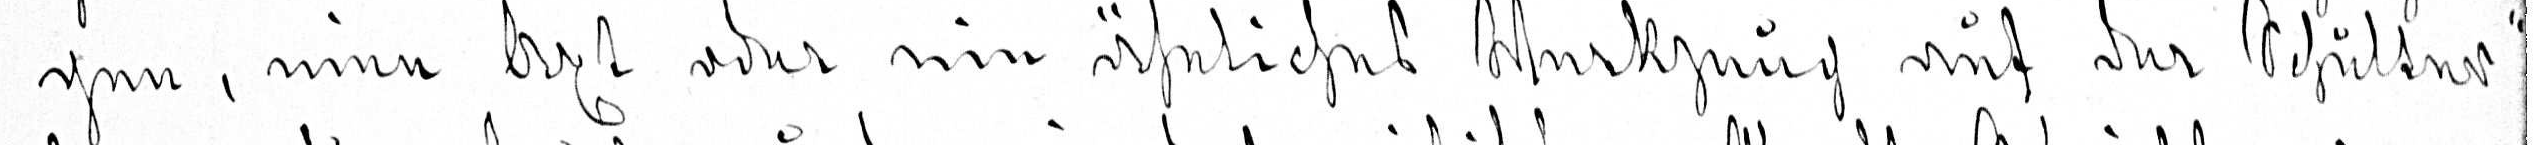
gen, eine Axt oder ein ähnliches Werkzeug auf der Schulter
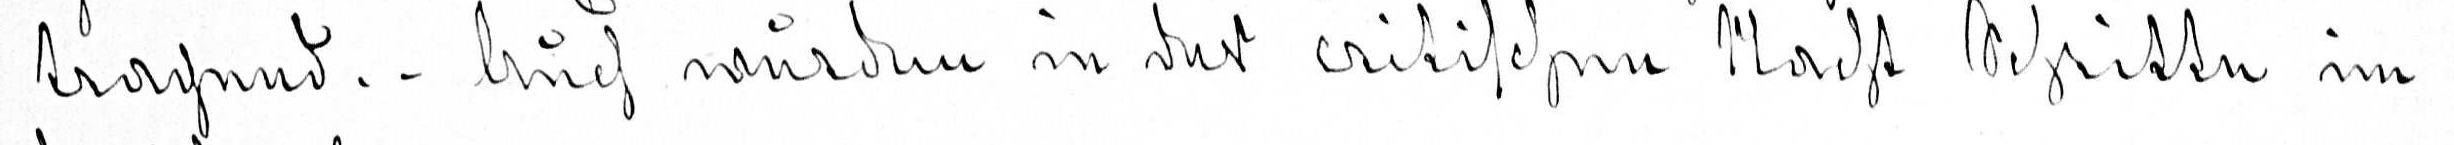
tragend. Auch wurden in der critischen Nacht Schritte im
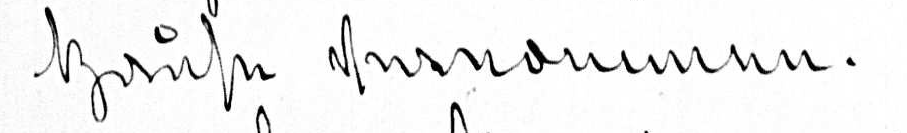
Hause vernommen.
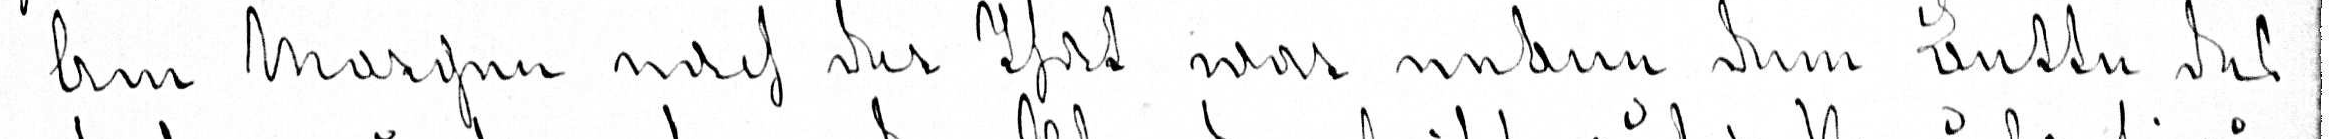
Am Morgen nach der That war neben dem Bette des
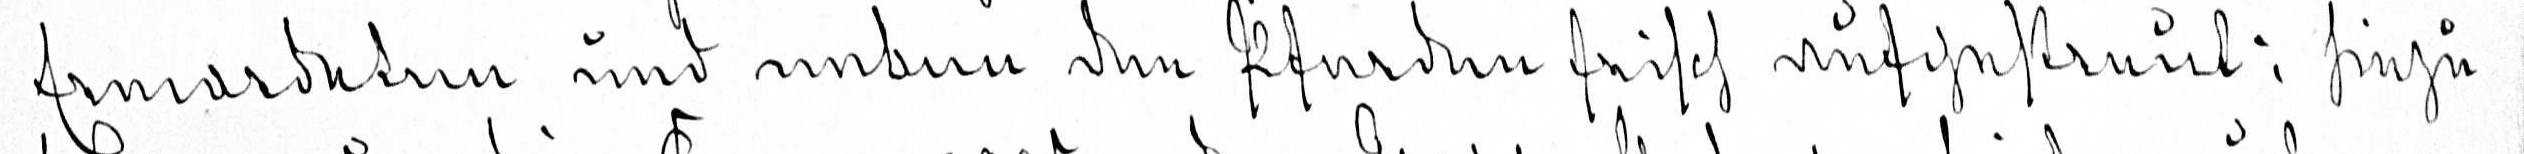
Ermordeten und neben den Pferden frisch aufgestreut: hinzu
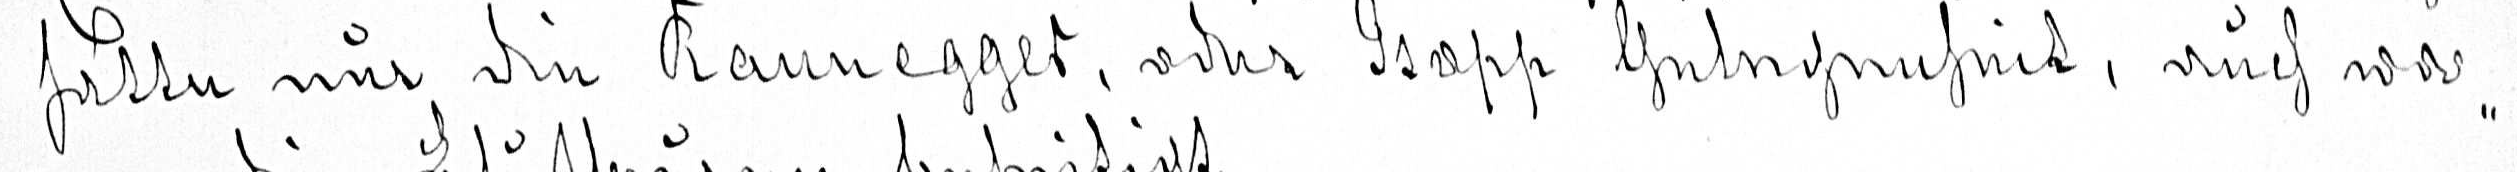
hatte nur die Raunegger, oder Isopp Gelegenheit, auch wa¬
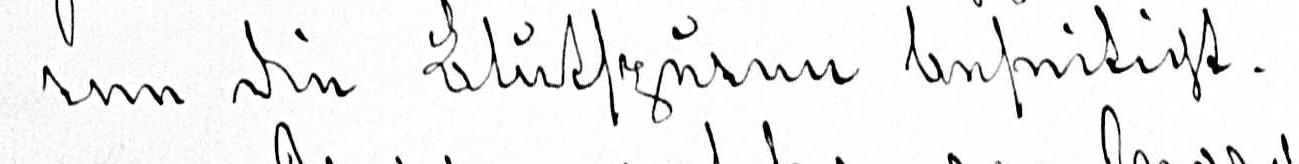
ren die Blutspuren beseitigt.
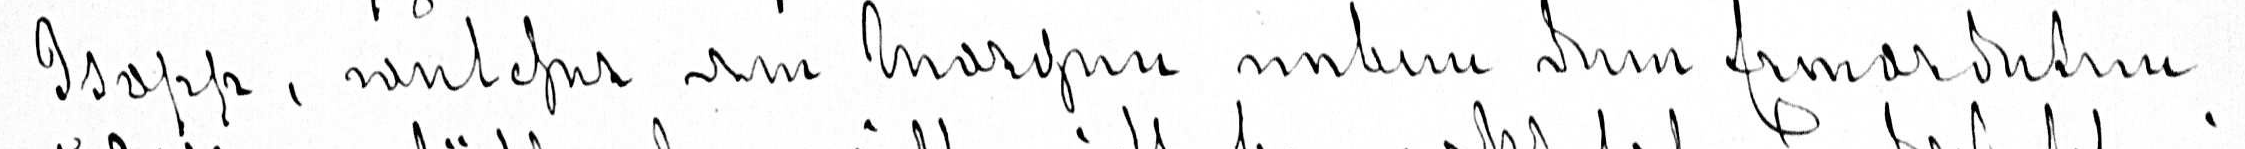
Isopp, welcher am Morgen neben dem Ermordeten
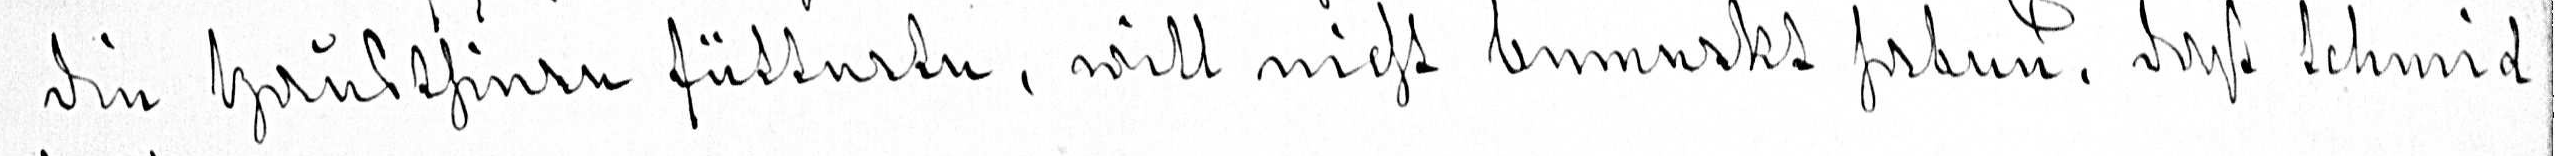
die Hausthiere fütterte, will nicht bemerkt haben, daß Schimd
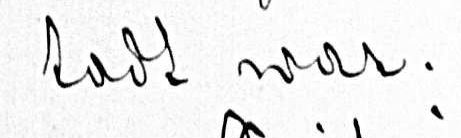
todt war.
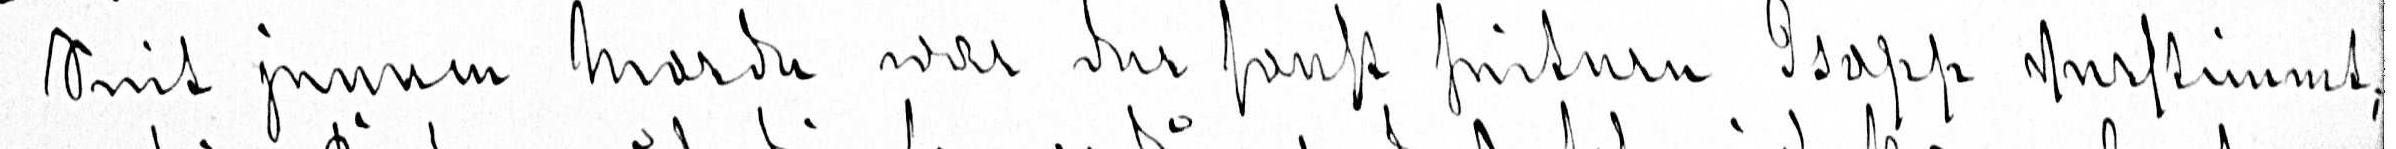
Seit jenem Morde war der sonst heitere Isopp verstimmt,
